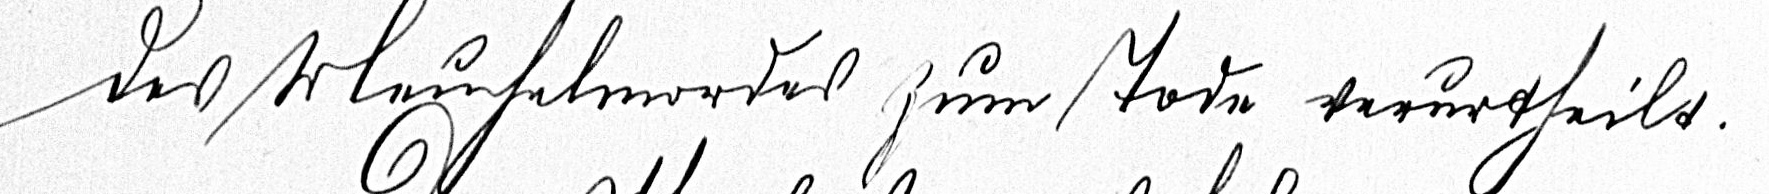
des Meuchelmordes zum Tode verurtheilt.
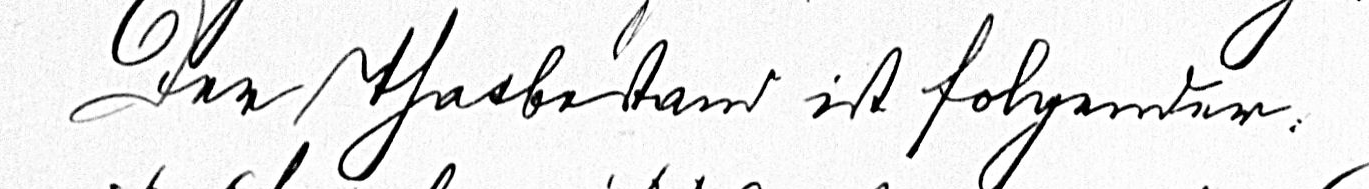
Der Thatbestand ist folgender.
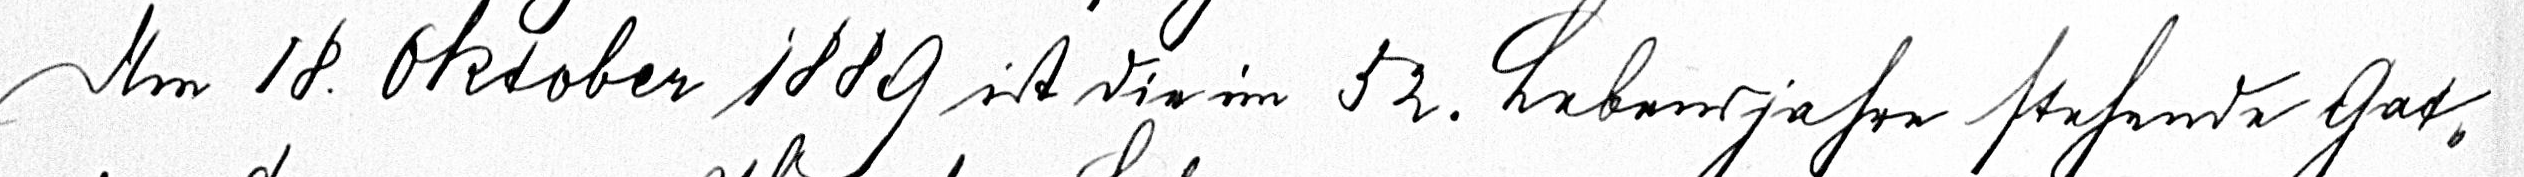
Am 18. Oktober 1889 ist die im 52. Lebensjahre stehende Gat¬
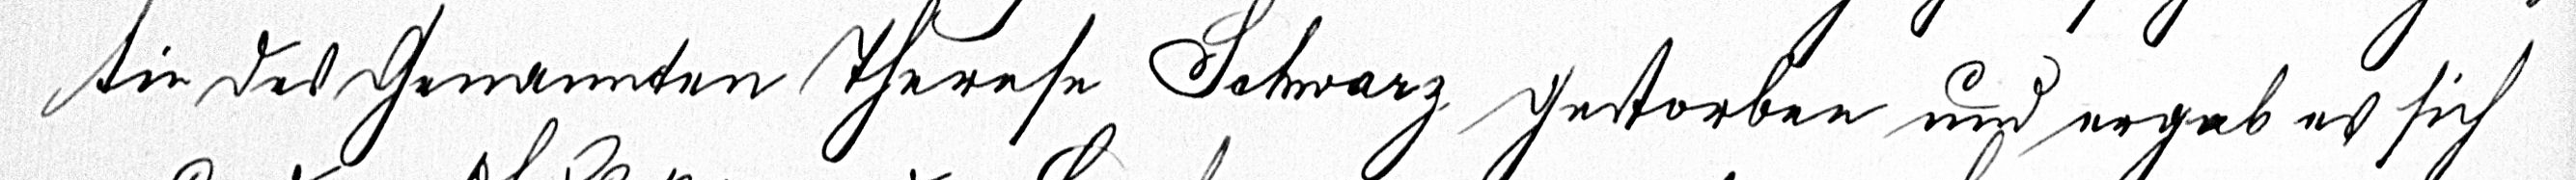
tin des Genannten Therese Schwarz gestorben und ergeb es sich
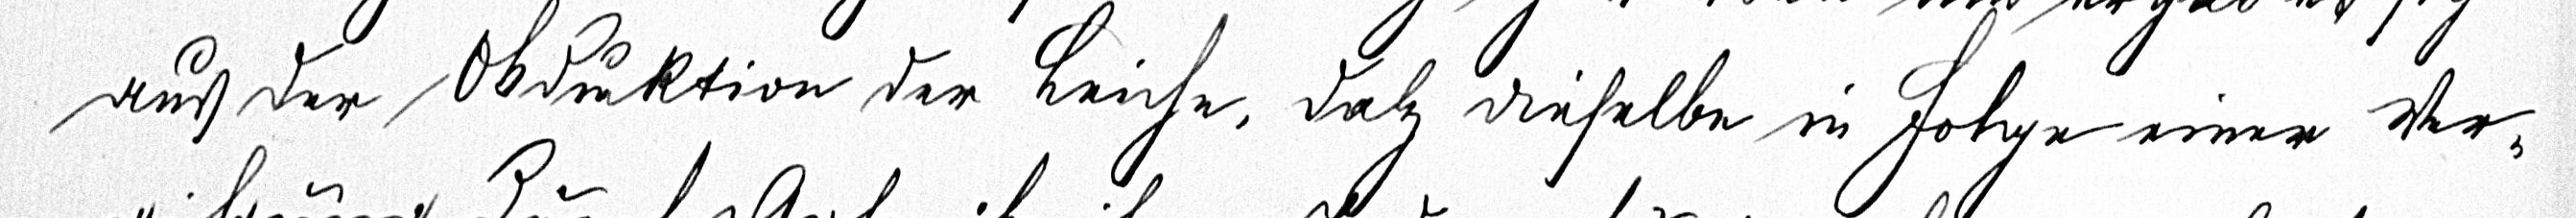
aus der Obduktion der Leiche, daß dieselbe in Folge einer Ver¬
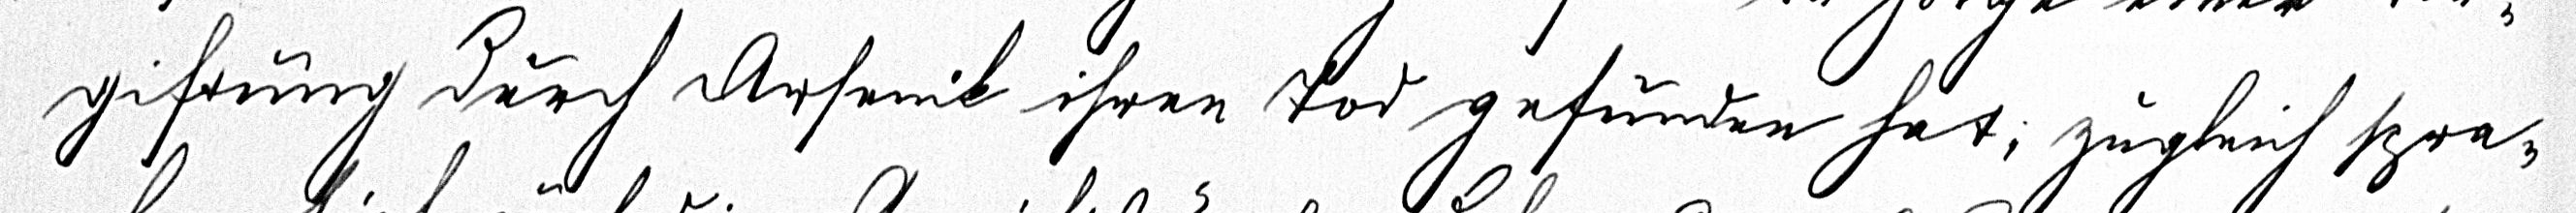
giftung durch Arsenit ihren Tod gefunden hat, zugleich spra¬
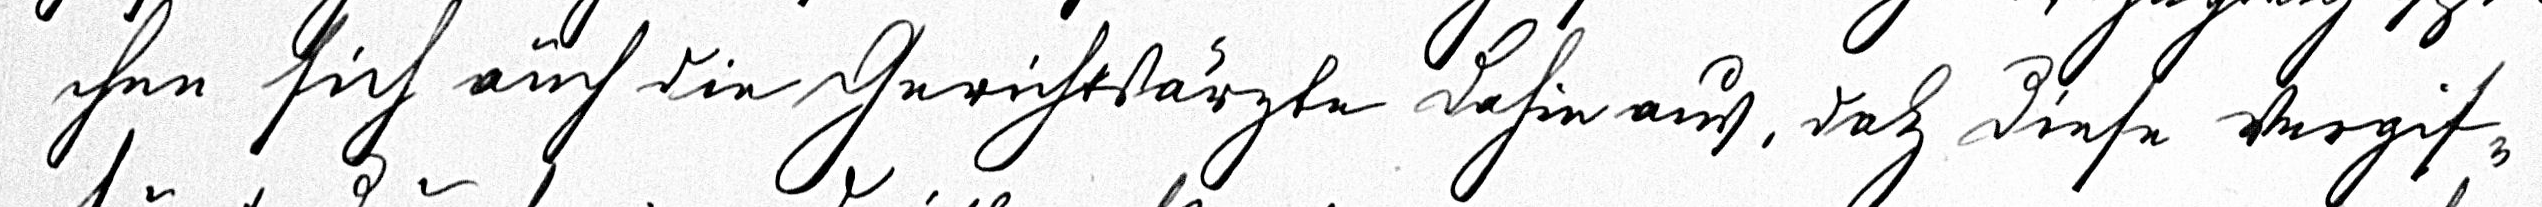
chen sich auch die Gerichtsärzte dahin aus, daß diese Vergif¬
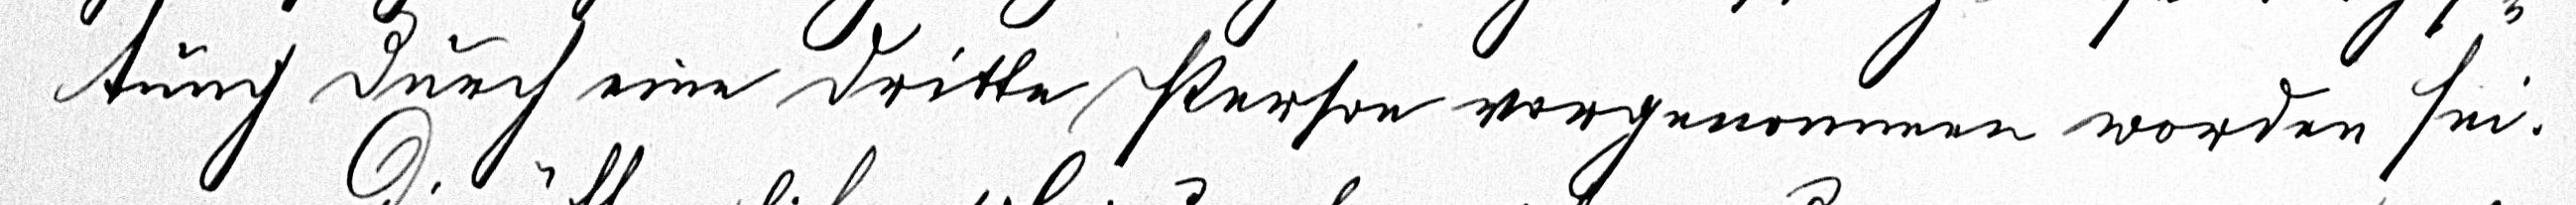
tung durch eine Dritte Person vorgenommen worden sei.
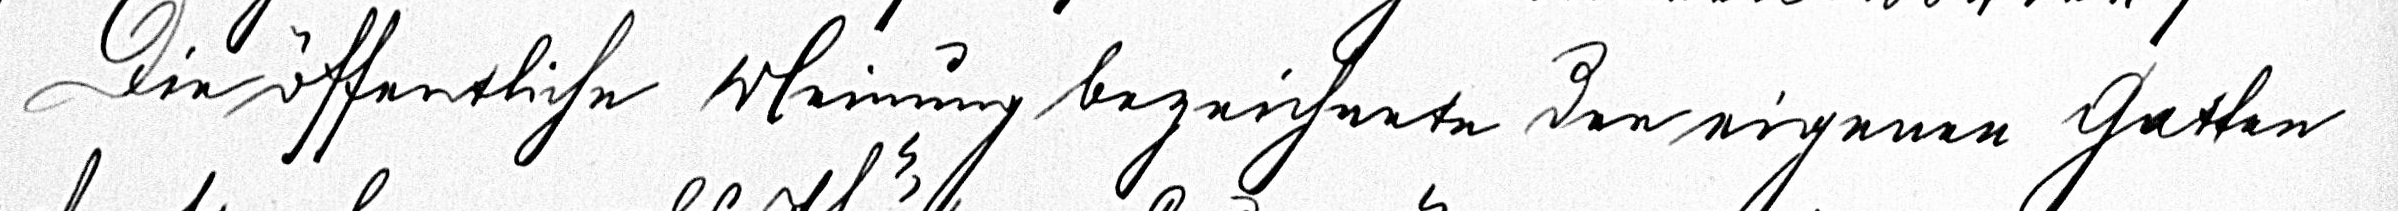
Die öffentliche Meinung bezeichnete den eigenen Gatten
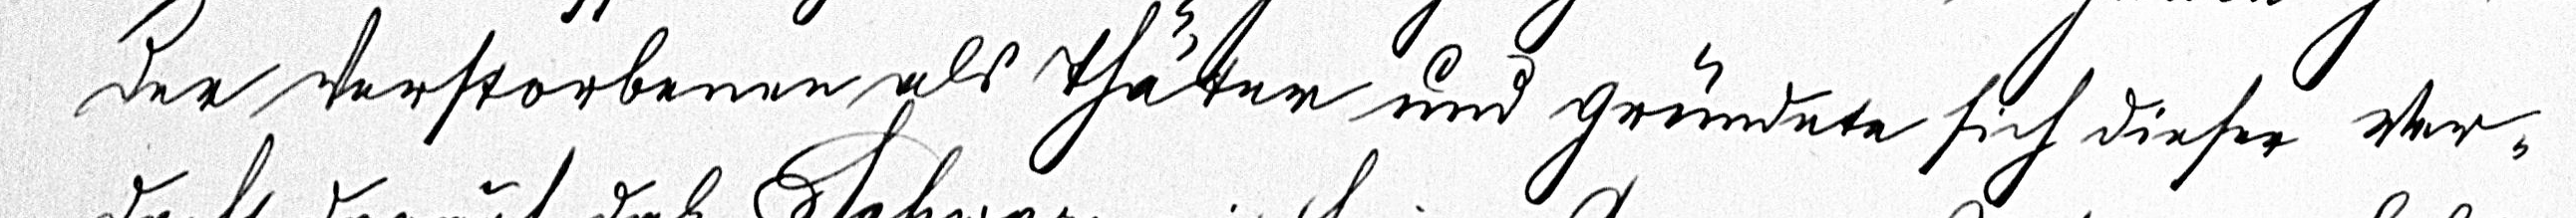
der verstorbenen als Thäter und gründete sich dieser ver¬
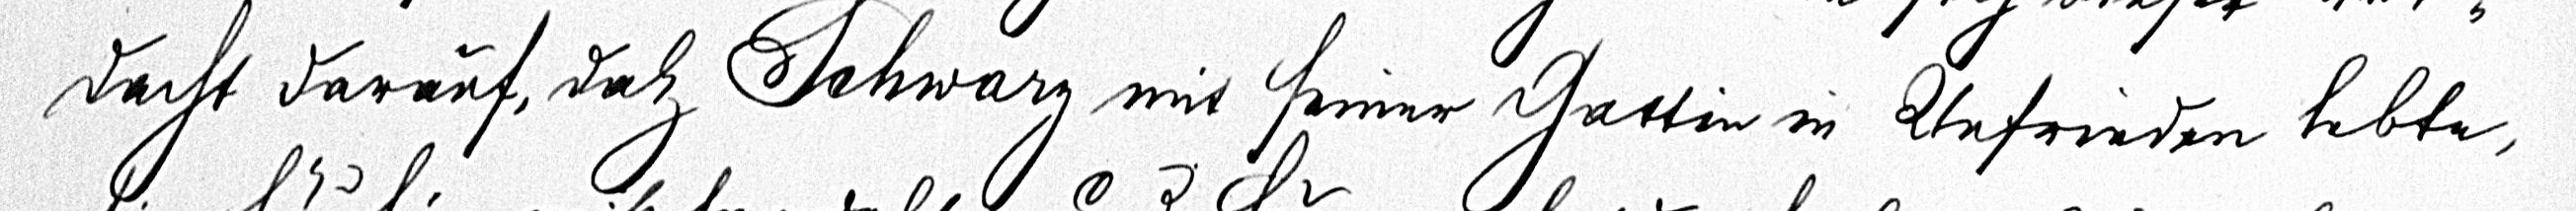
dacht darauf, daß Schwarz mit seiner Gattin in Unfrieden lebte,
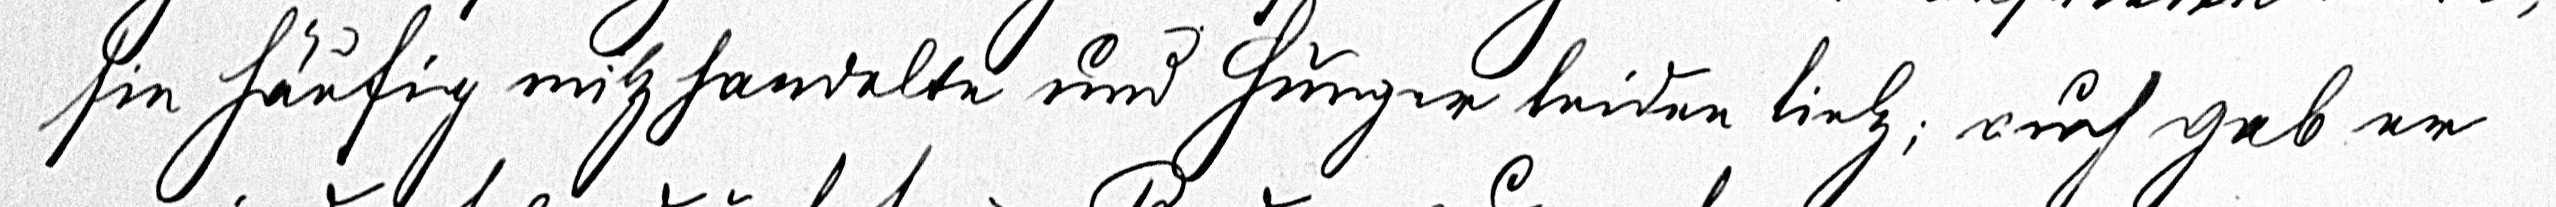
sie Häufig mißhandelte und Hunger leiden ließ; auch geb er
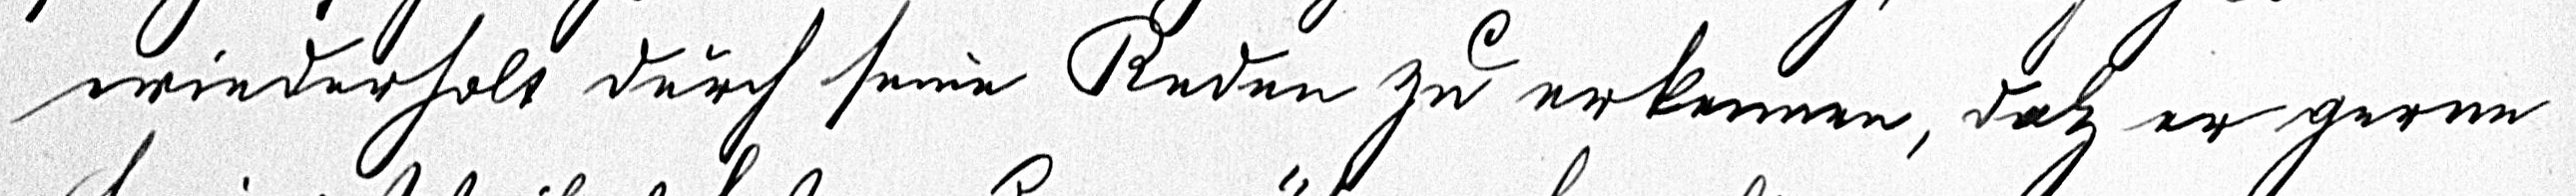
wiederholt durch seine Reden zu erkennen, daß er gerne
